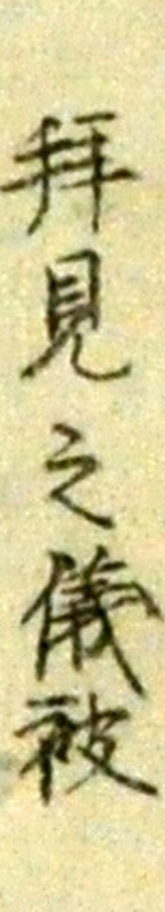拝見之儀被
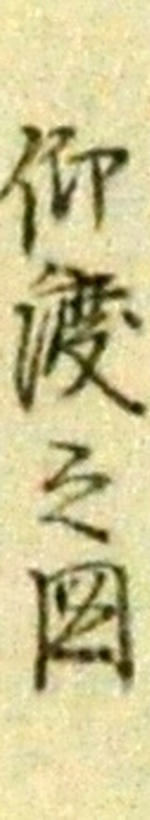仰渡之図

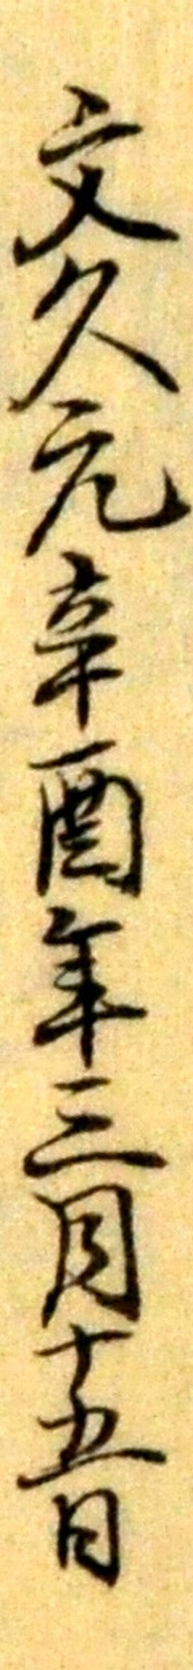文久元辛酉年三月十五日
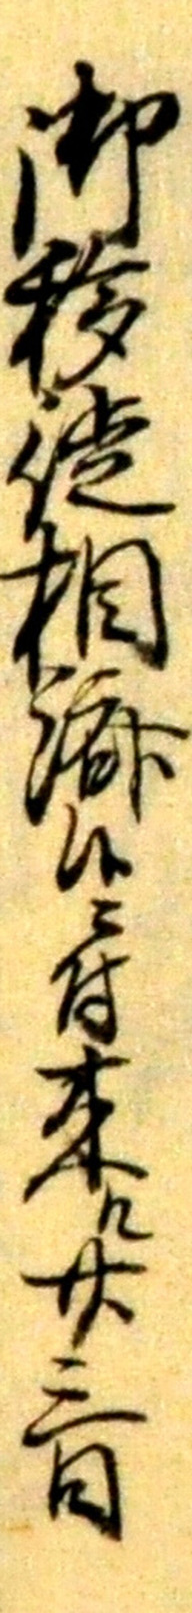御移徙相済候ニ付来ル廿三日
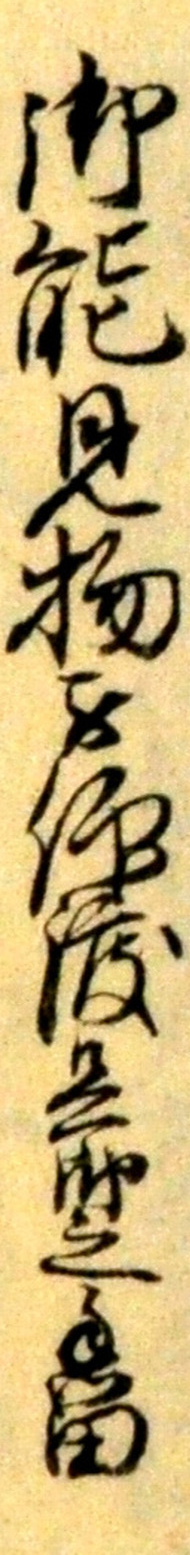御能見物被仰渡候節之手留

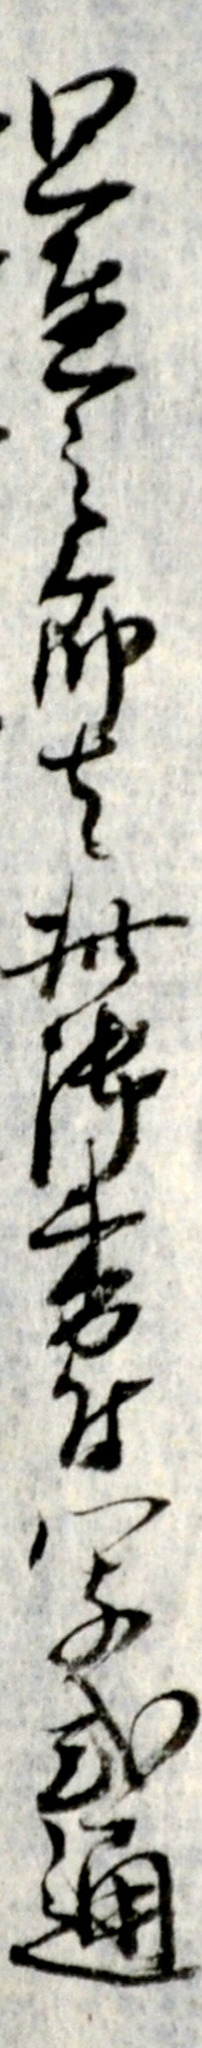廻達之節は此御書付写弐通
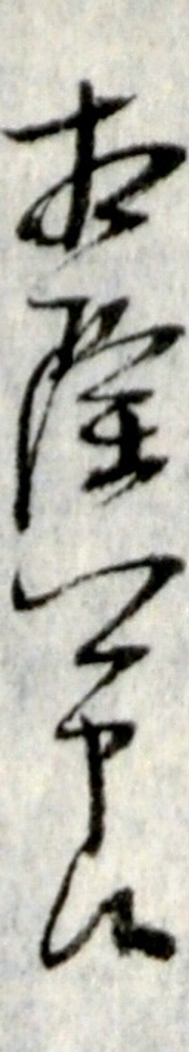相除可申候

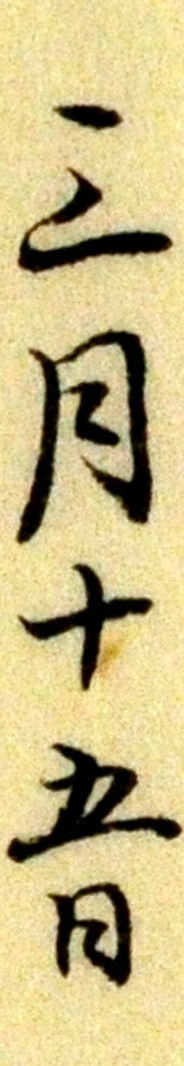三月十五日
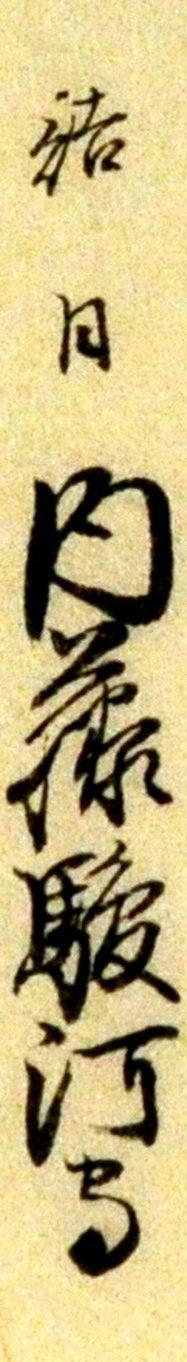詰日内藤駿河守
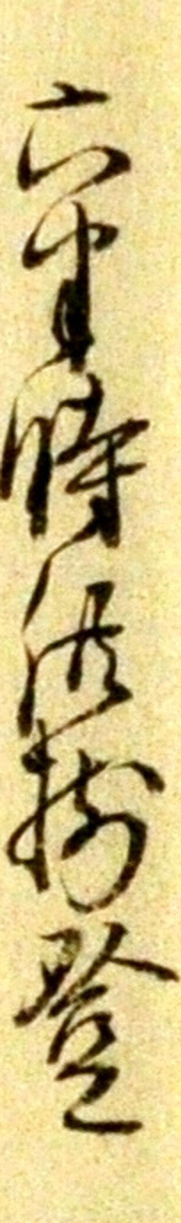六半時供揃登
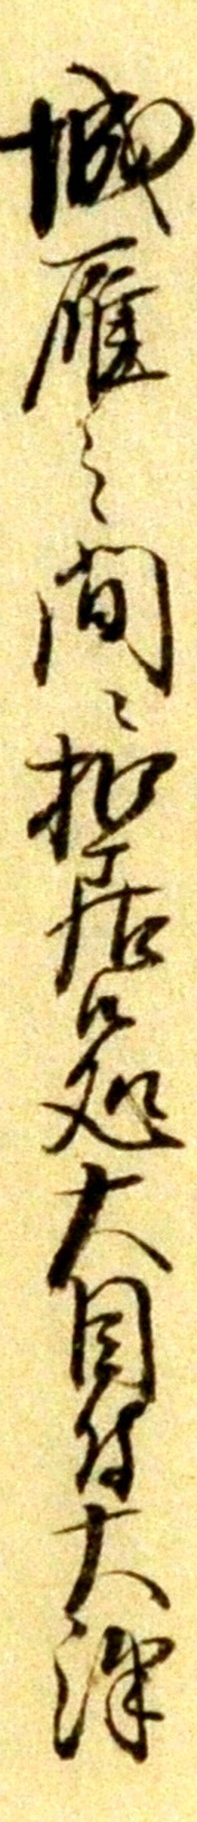城雁之間ニ扣居候処大目付大澤
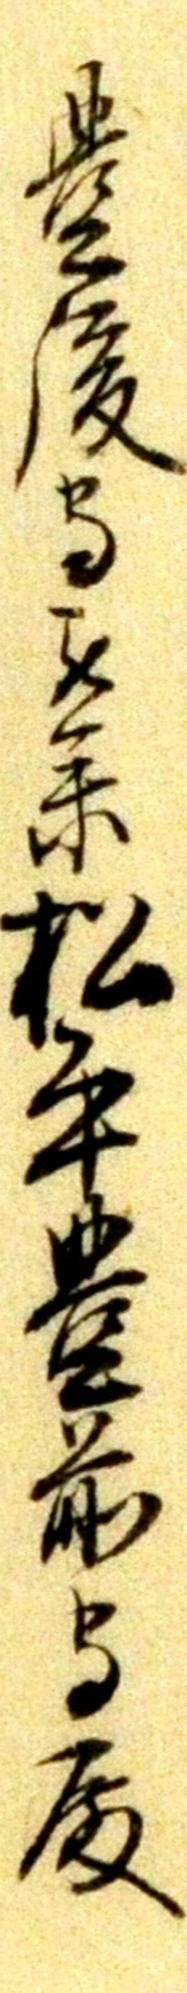豊後守被参松平豊前守殿
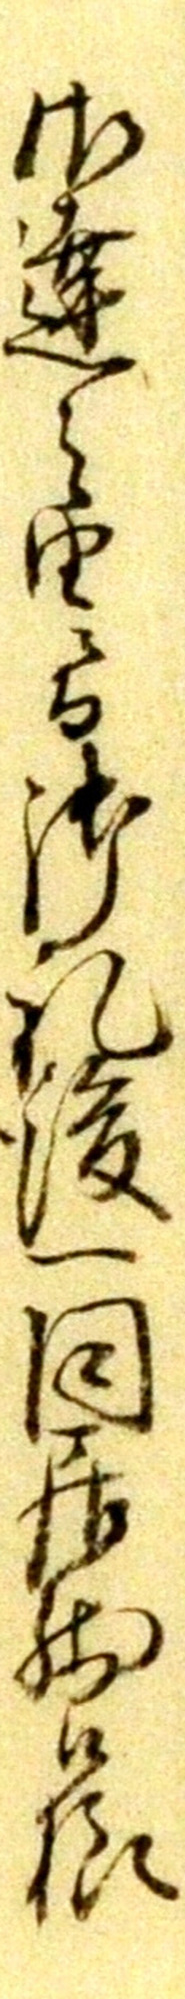御達之由ニ而御礼後一同居残候様
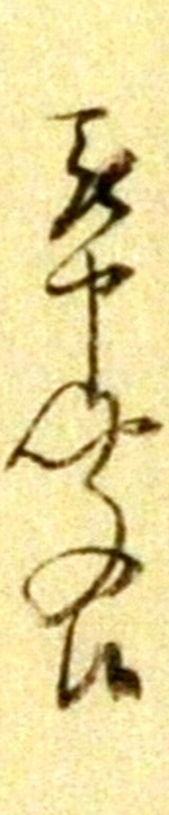被申聞候
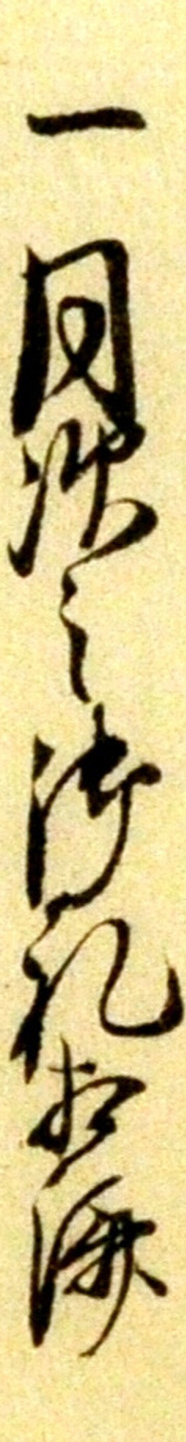一月次之御礼相済
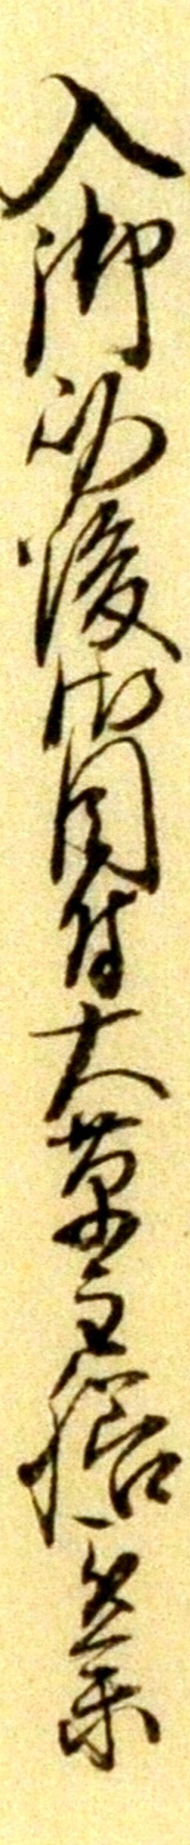入御以後御目付大草主膳被参
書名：御移徒相済御祝儀御能ノ節ノ留外
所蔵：伊那市立高遠町図書館・合同会社AMANE
